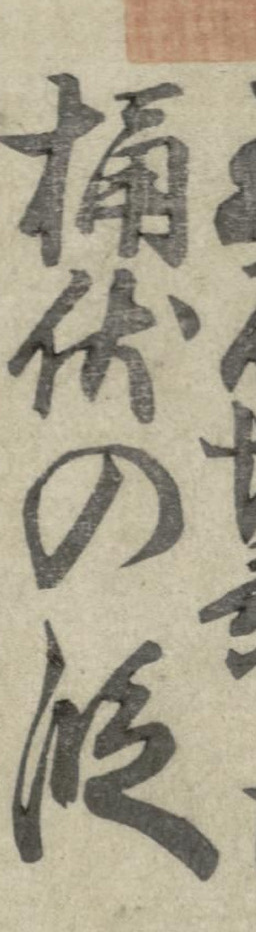桶伏の段
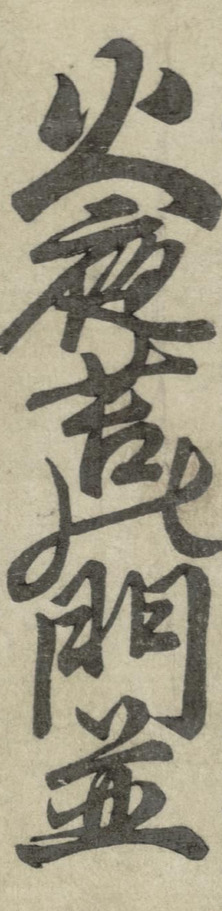火夜苦の門並
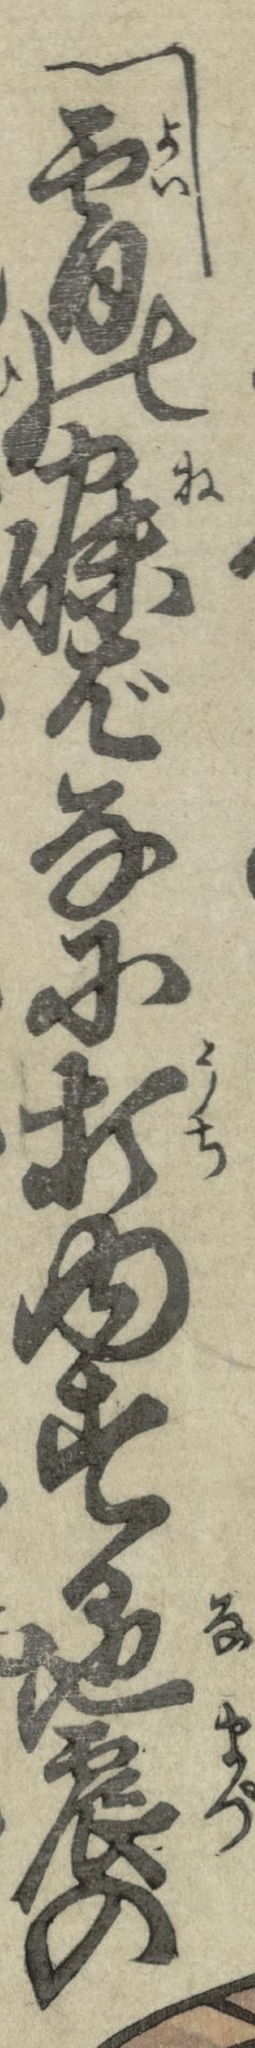〽宵の寝ばなに打ゆする地震の
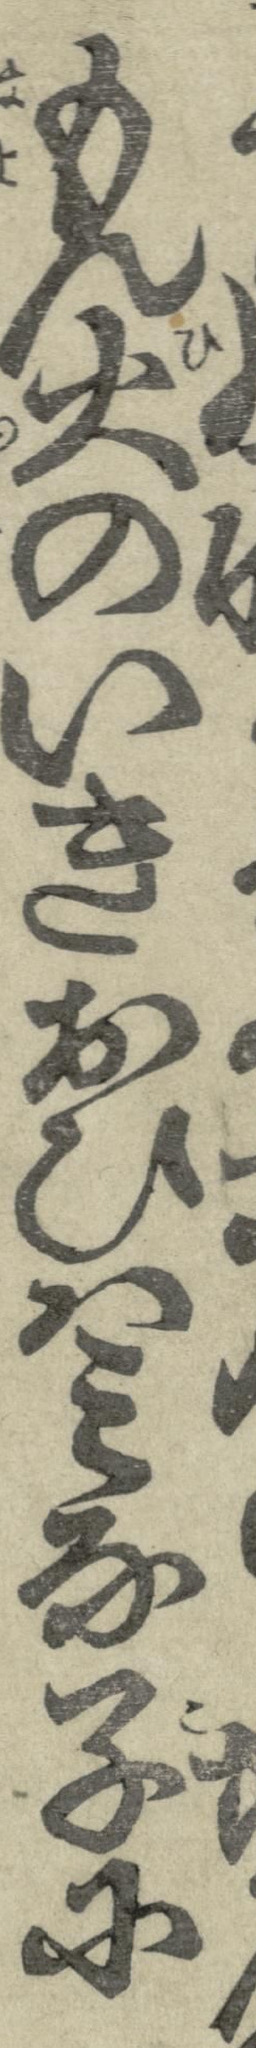もん火のいきおひはみな子に
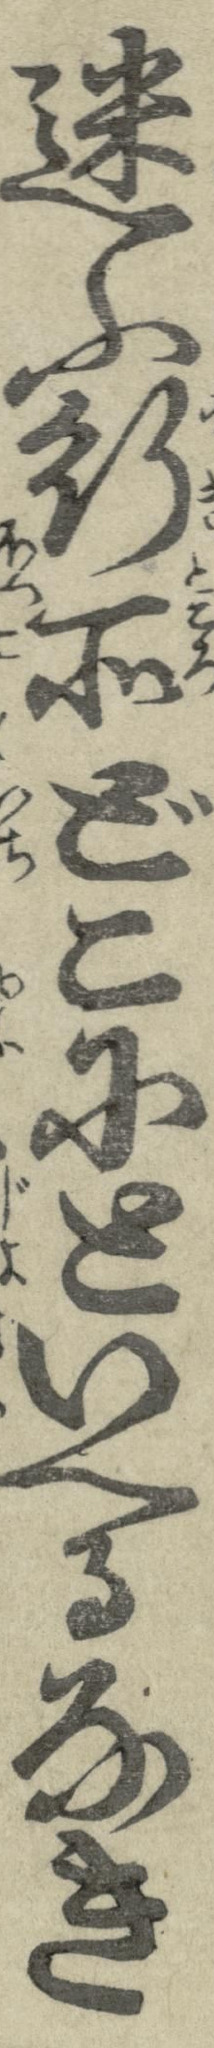迷ふ行所どこにといへるなき
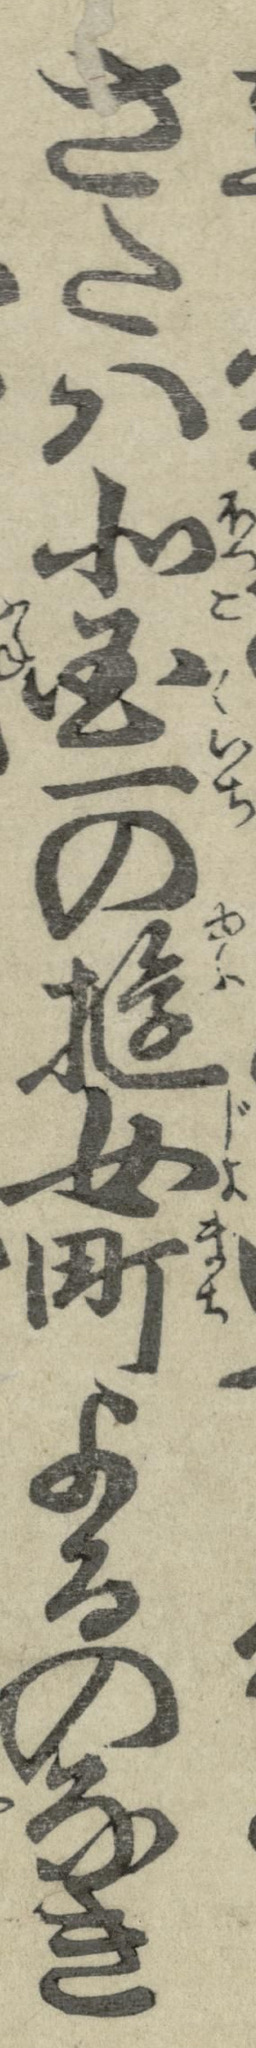さたは北国一の遊女町よるのなき
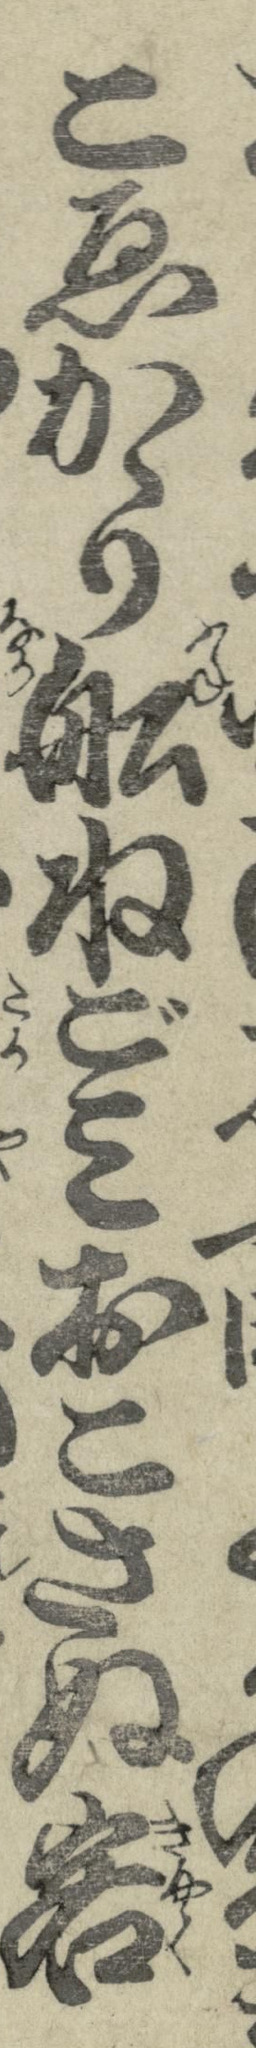こゑかゝり船ねごみおこさぬ客
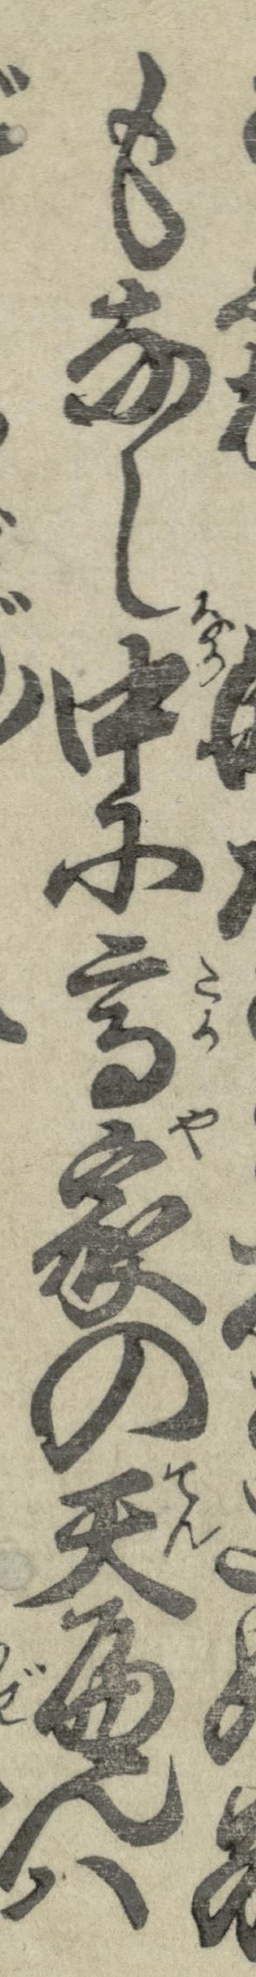もなし中に高家の天へんは
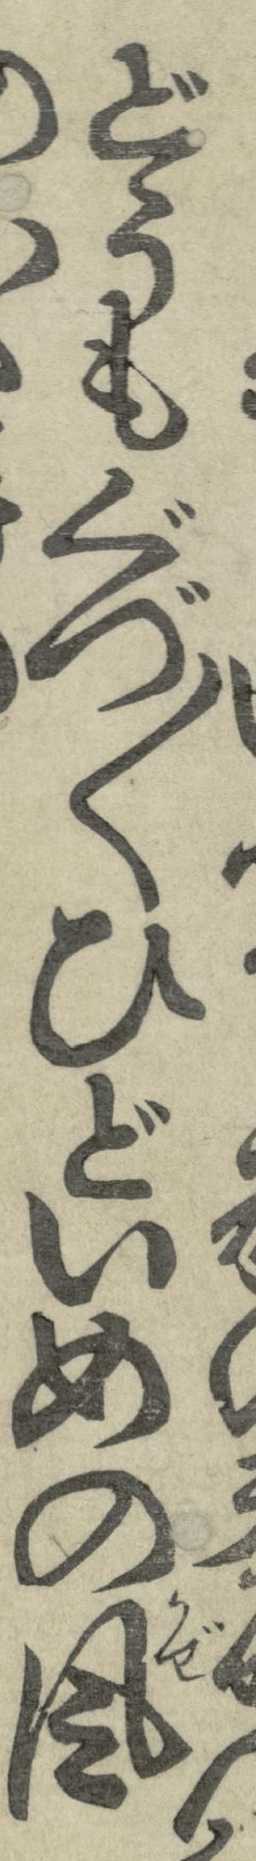どうもぐづ〳〵ひどいめの風
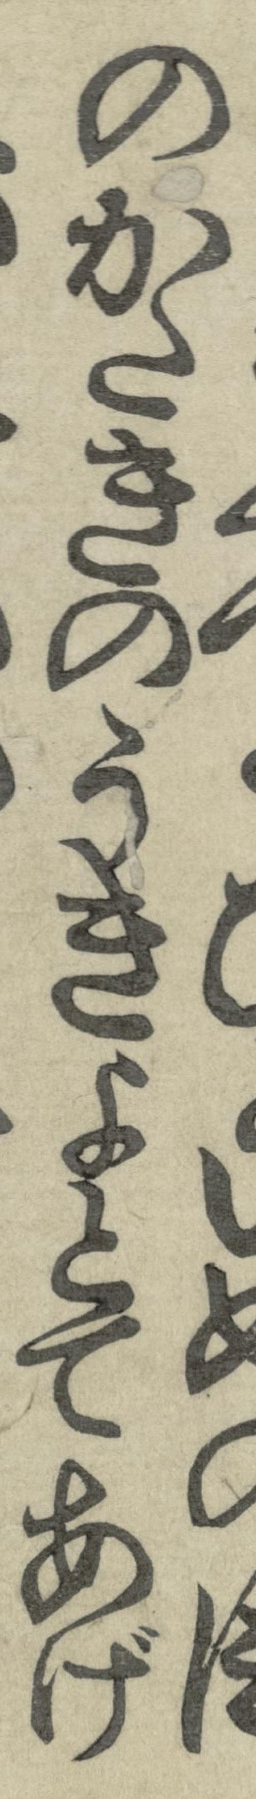のかたきのうきよとてあげ
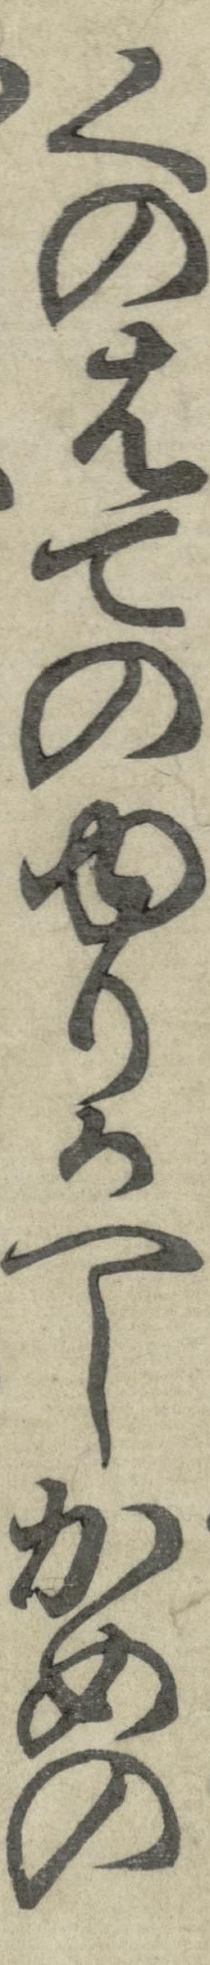くのはてのゆりかへしかめの
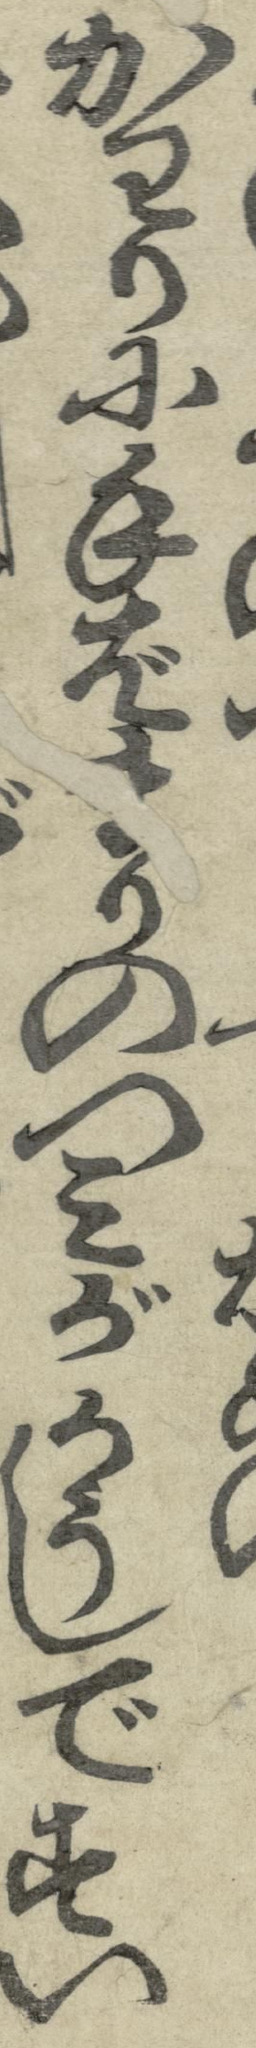かわりに手ばさりのつみがかうしですい
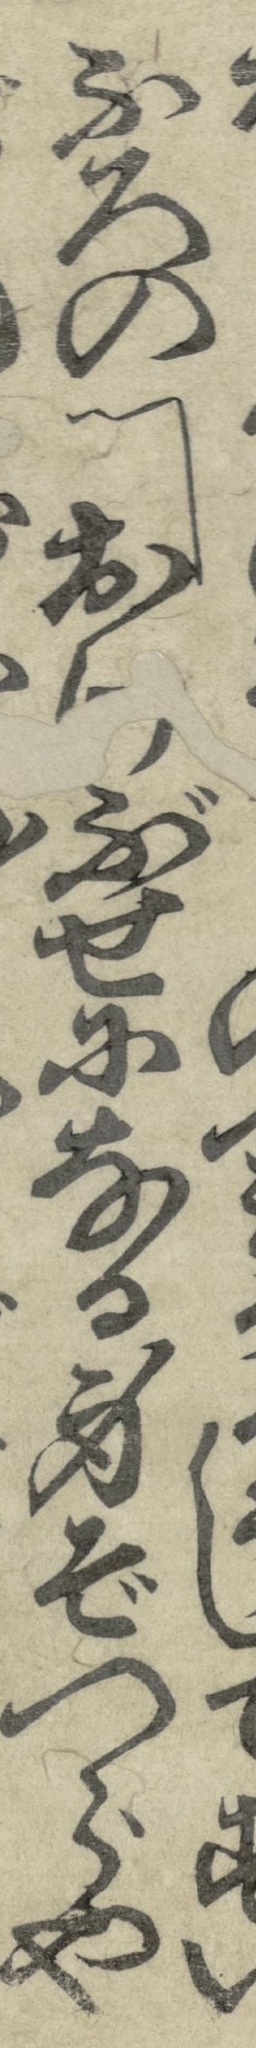ふろの〽おつぶせになる身ぞつらや
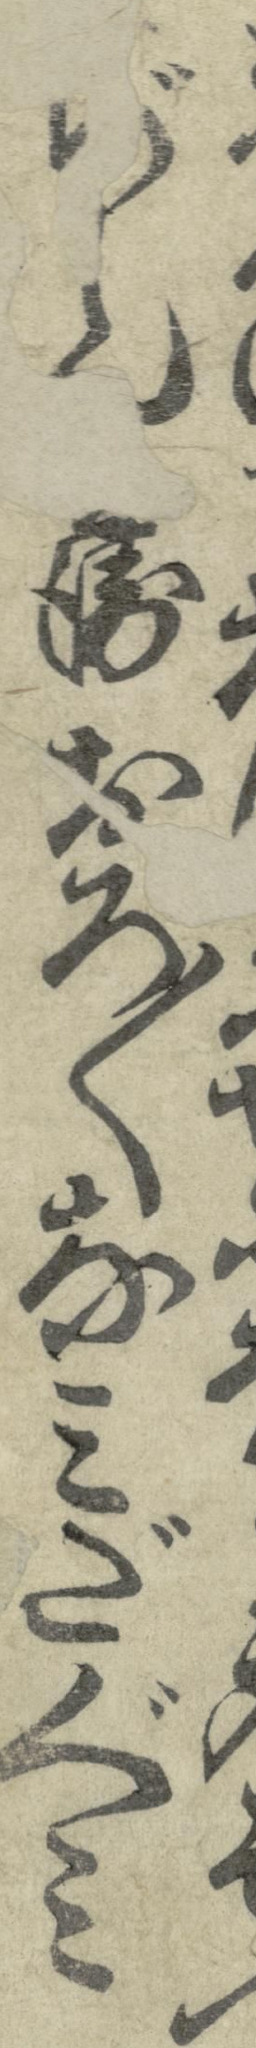づ新兵衛？おろ〳〵なみだぐみ
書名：火夜苦の門並
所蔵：東京大学地震研究所図書室 Earthquake Research Institute Library, The University of Tokyo, JAPAN
